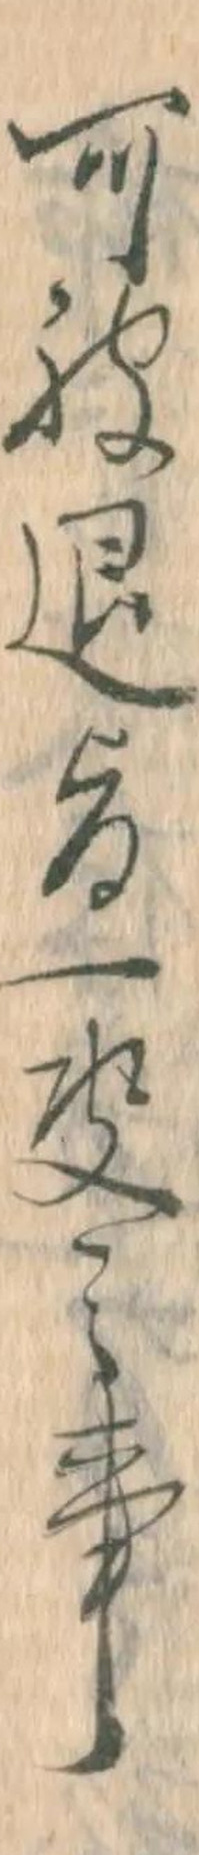可致退旨一決之事
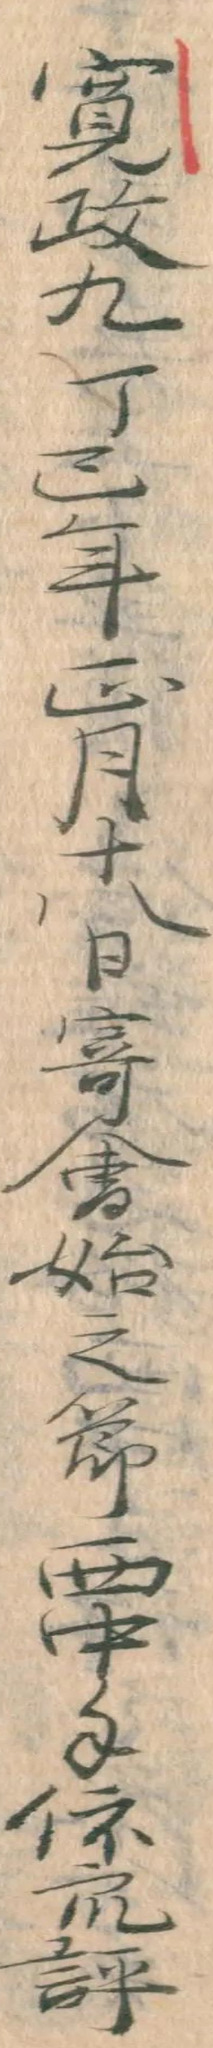寛政九丁巳年正月十八日寄會始之節西中手依衆評
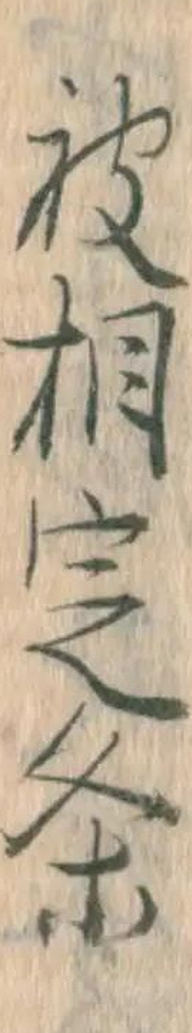被相定条
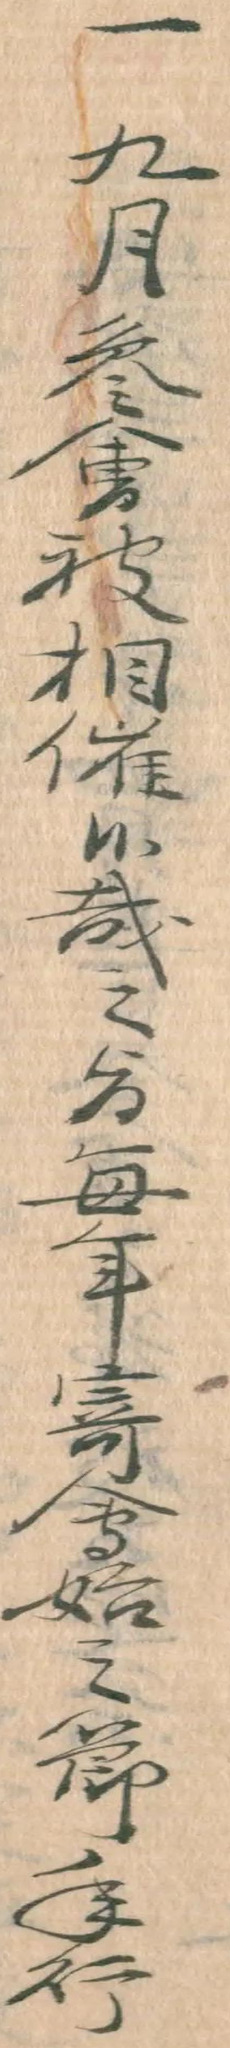一九月参會被相催候哉之旨毎年寄會始之節年行
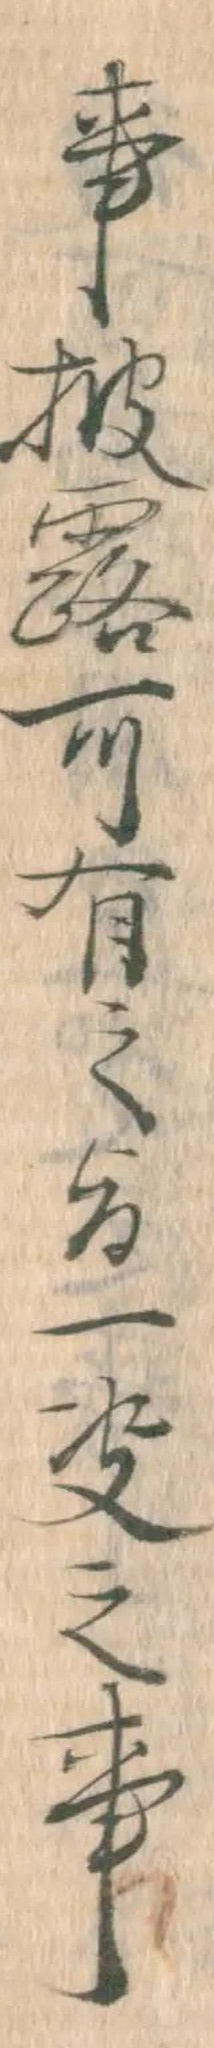事披露可有之旨一決之事
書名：賀茂社記録. 第29冊
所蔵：国立国会図書館 National Diet Library, JAPAN
